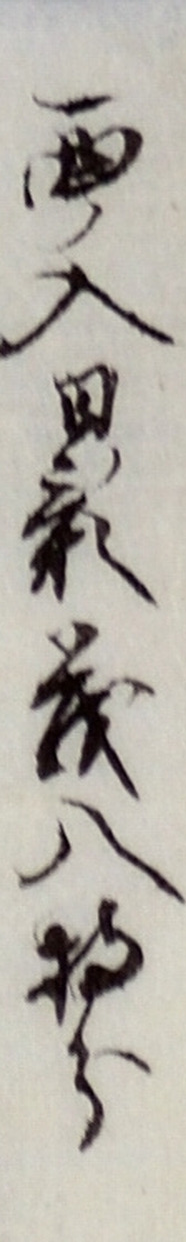西ノ入日ノ影茂八持分
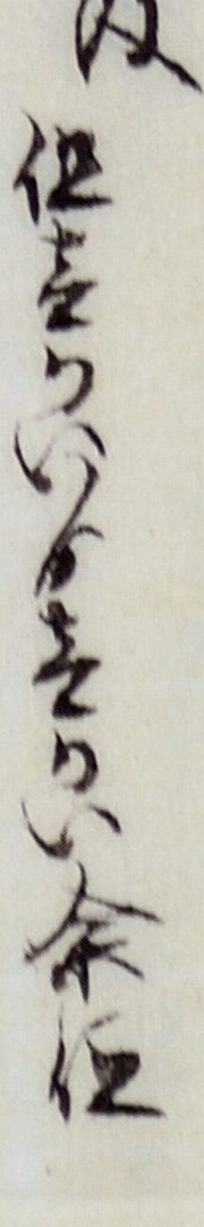但壱ケいゟ壱ケい余位
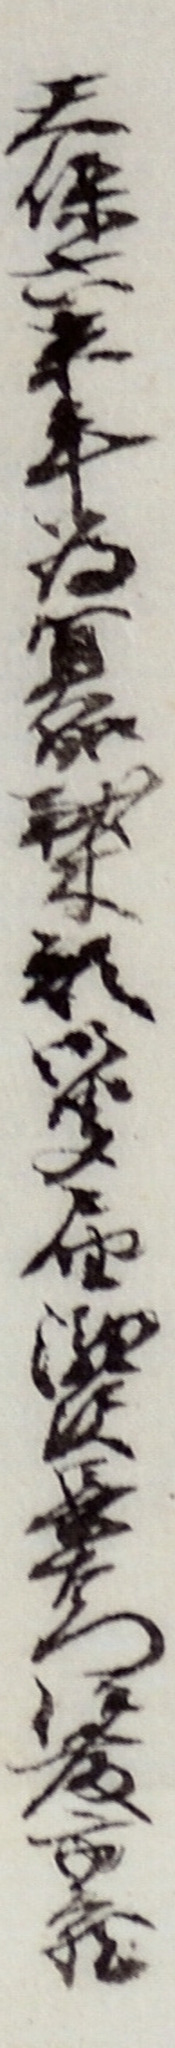天保六未年為冥加献木願御聞届瀧沢長右衛門伊藤市蔵
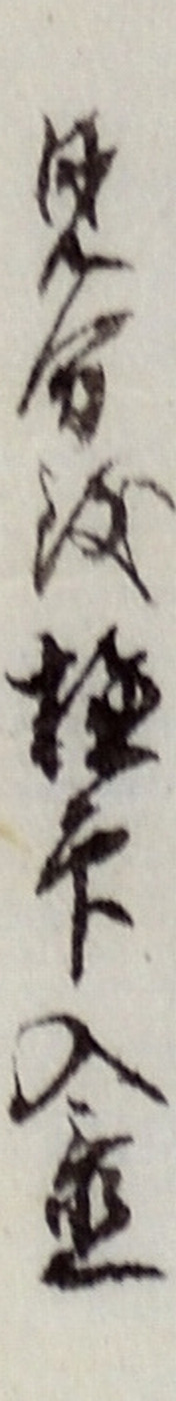見分致極印入置
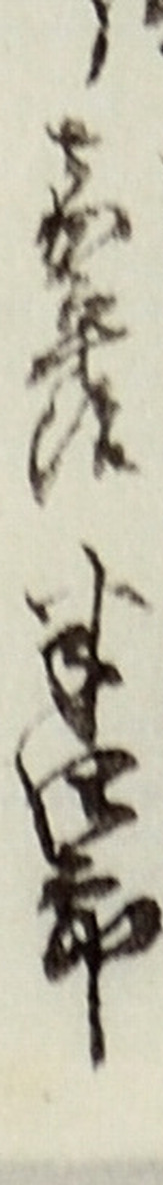嘉平治半四郎
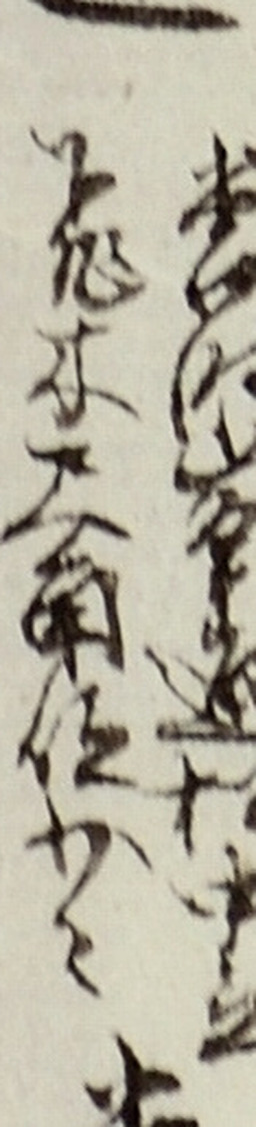飛木尺角位少々
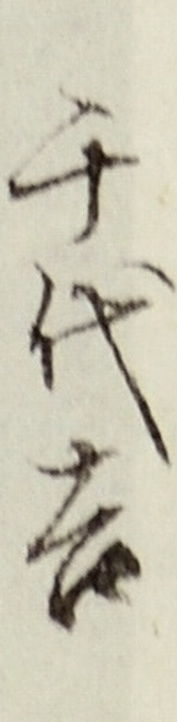千代吉
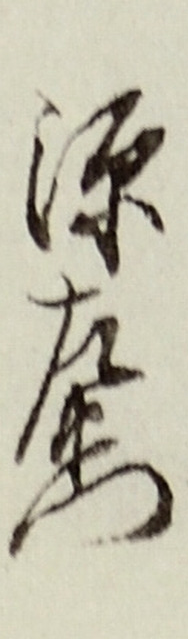源左衛門
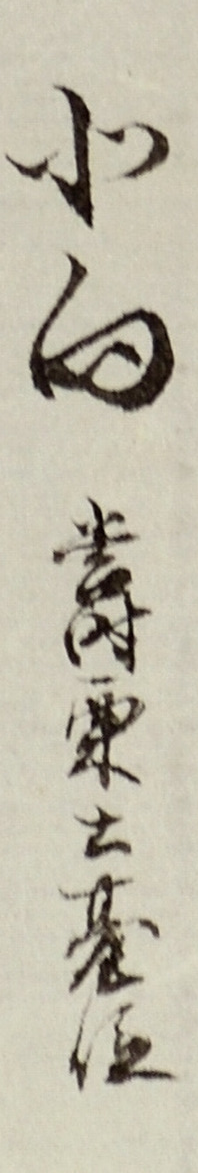北向当時栗土台位

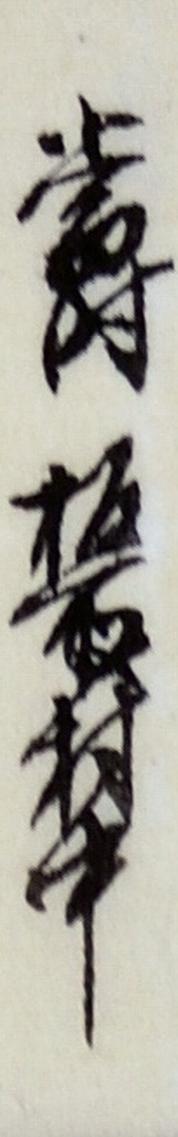当時板取村中
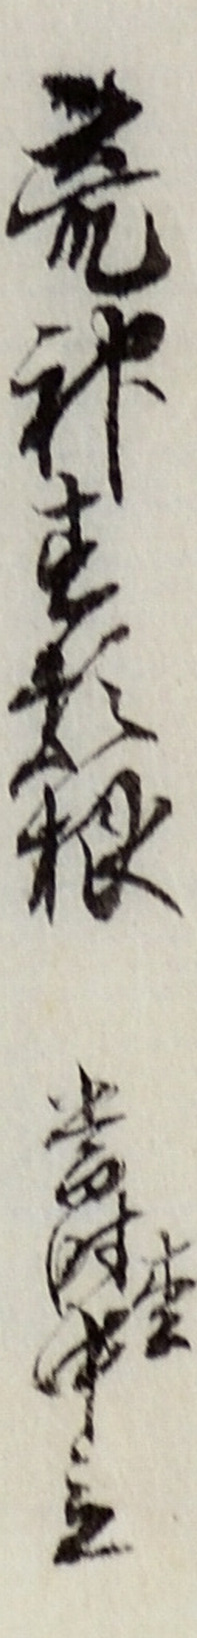荒神する根当時松中立
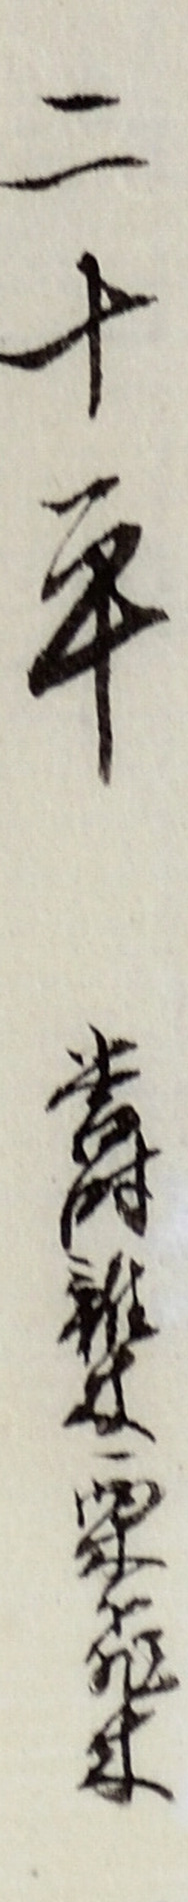二十平当時雑木栗飛木
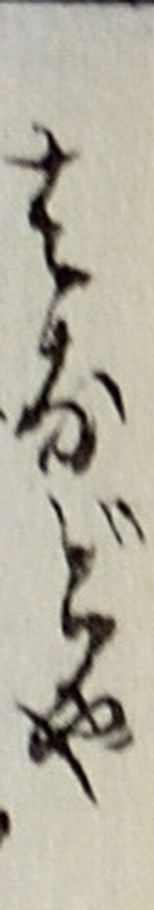はなどや
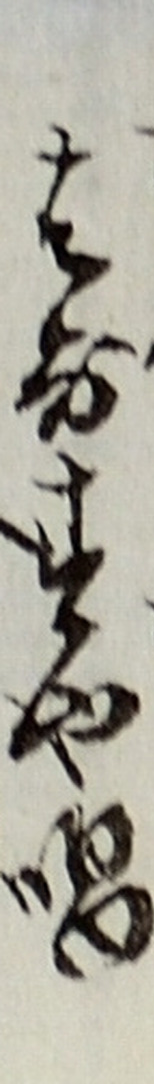はなすや唱
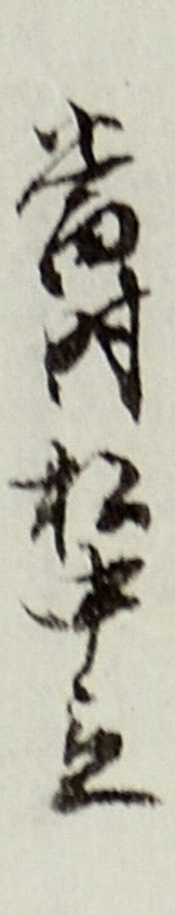当時松中立
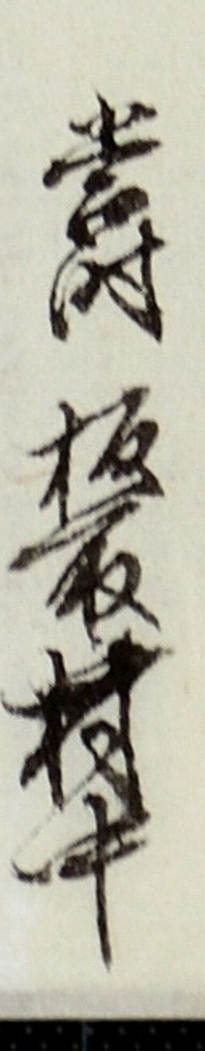当時板取村中
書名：山林帳草稿
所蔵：伊那市立高遠町図書館・合同会社AMANE
